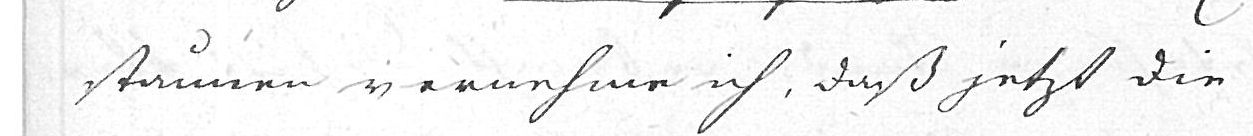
staunen vernehme ich, daß jetzt die
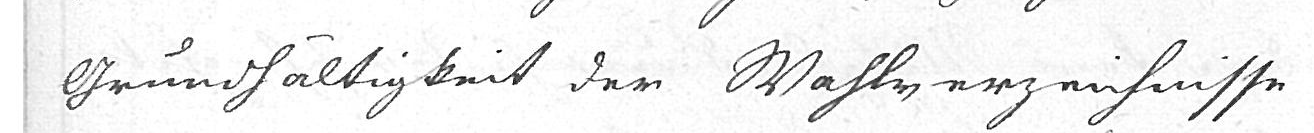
Grundhältigkeit der Wahlverzeichnisse
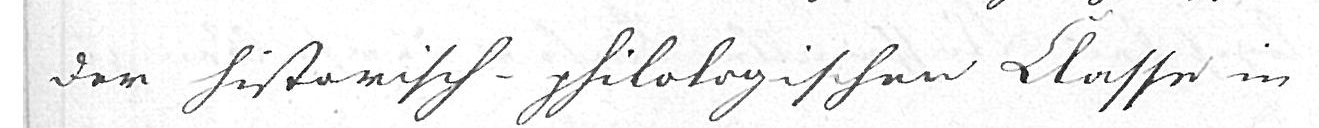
der historisch-philologischen Classe in
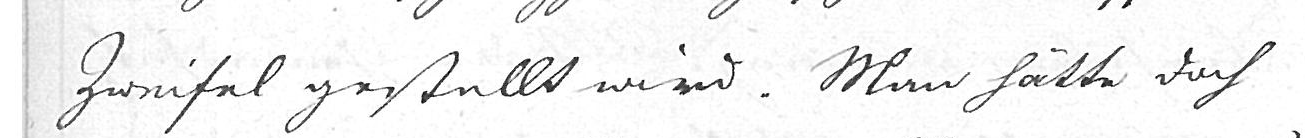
Zweifel gestellt wird. Man hätte doch
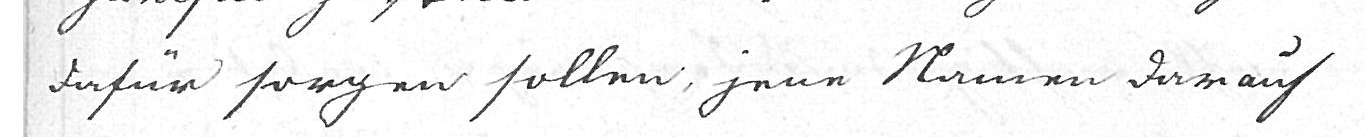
dafür sorgen sollen, jene Namen darauf
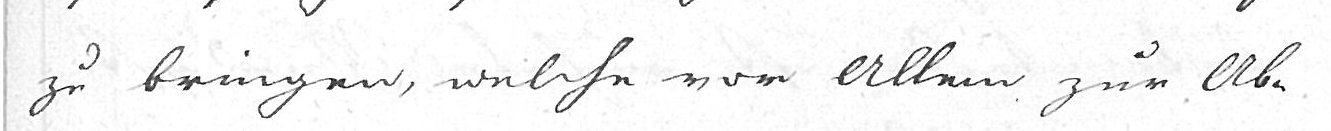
zu bringen, welche vor Allem zur Ab-
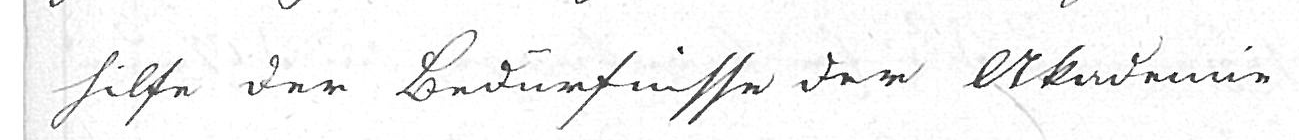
hilfe der Bedürfnisse der Akademie
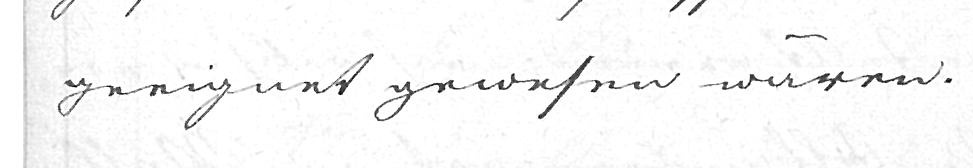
geeignet gewesen wären.
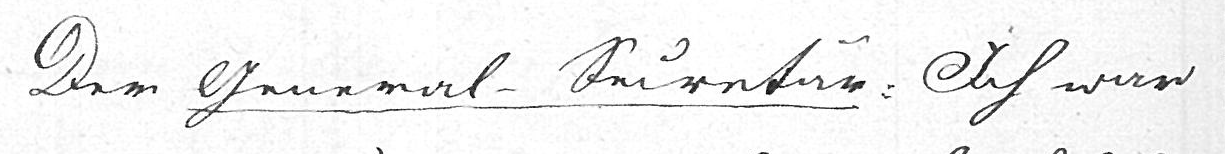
Der General-Secretär: Ich war
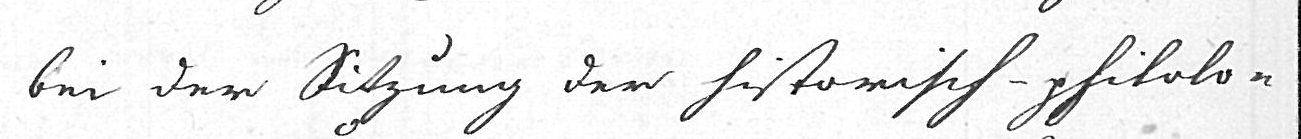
bei der Sitzung der historisch-philolo-
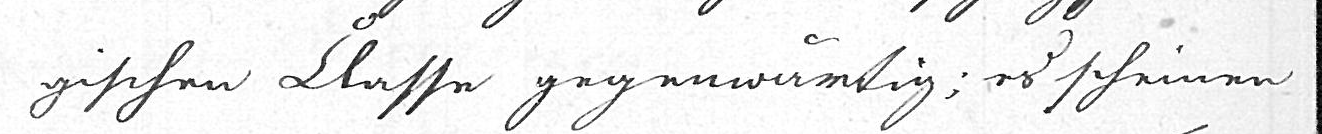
gischen Classe gegenwärtig; es scheinen
